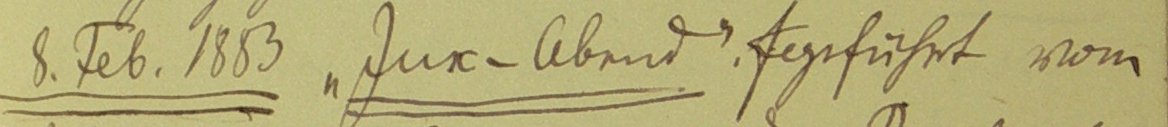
8. Febr.1883 „Jux-Abend. Aufgeführt vom
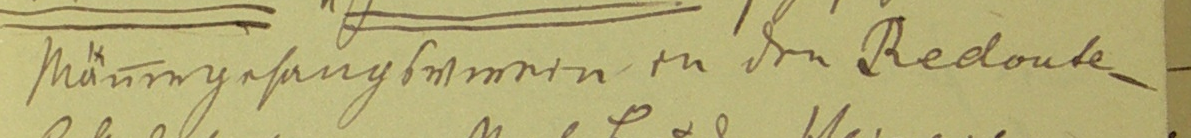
Männergesangsverein in der Redoute,-
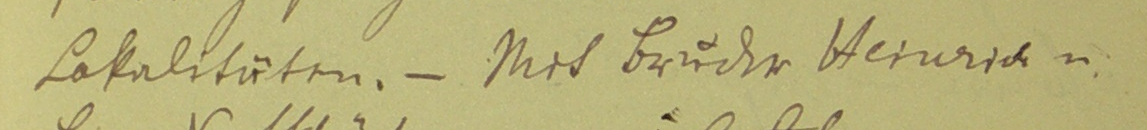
Lokalitäten.- Mit Bruder Heinrich und
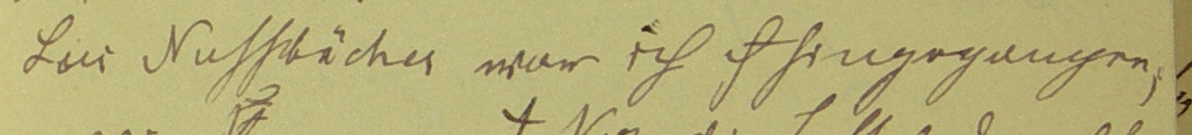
Lou Nussbächer war ich mit hingegangen
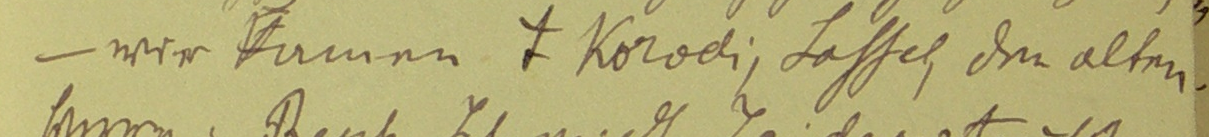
- wie kamen mit Korodi, Lassel, den alten
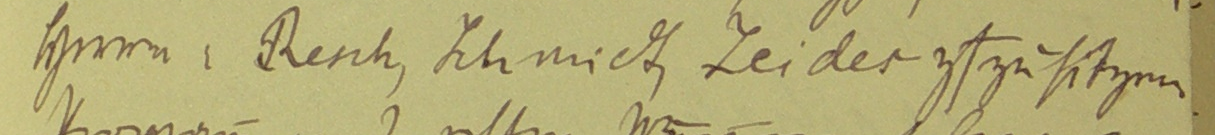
Herrn: Resch, Schmidt, Zeider zusammenzusitzen.
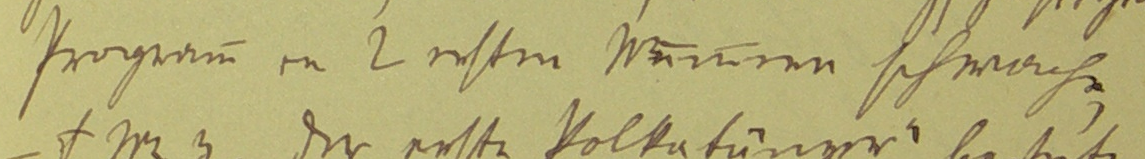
Programm in 2 ersten Nummern schwache
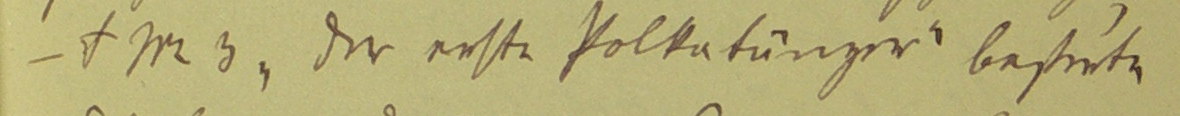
– nach Nr: 3 „ Der erste Polkatänzer“ ?beßerte
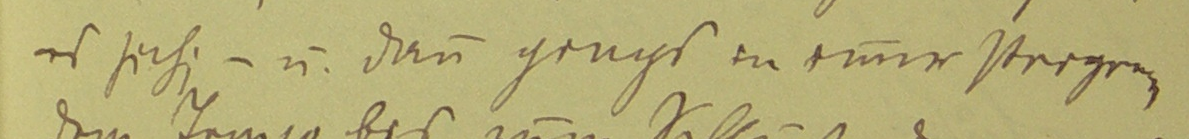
es sich ,- und dann gings in einem Reigen
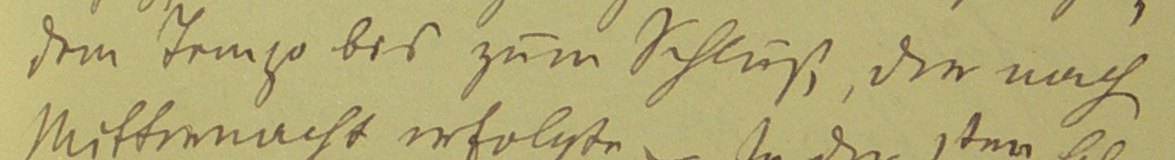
dem Tango bis zum Schluß, der nach
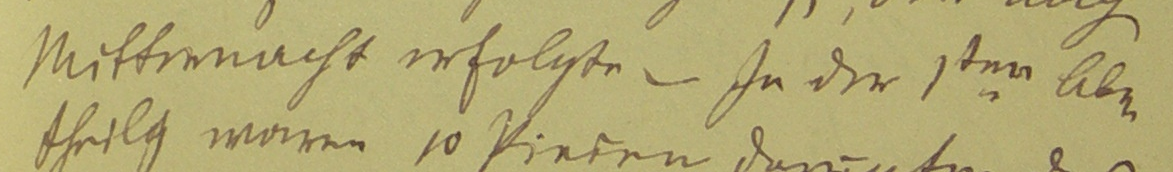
Mitternacht erfolgte .- In der 1-ten Ab¬
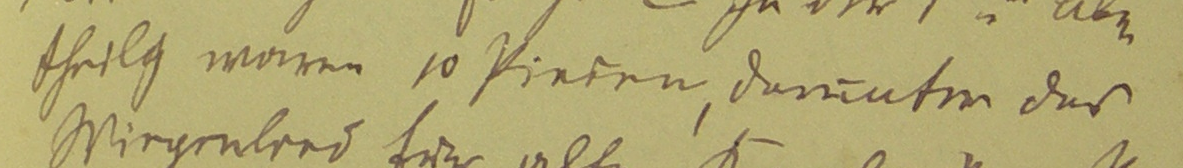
theilung waren 10 Piesen darunter das
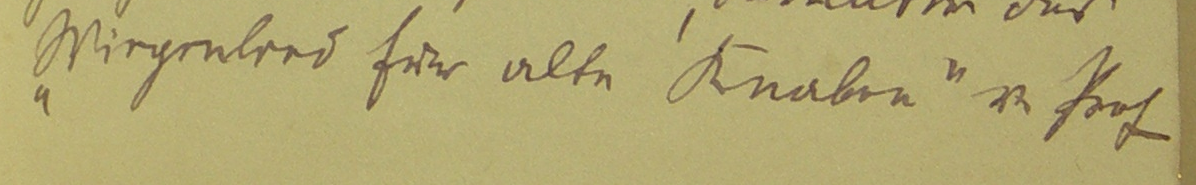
„ Wiegen lied für alte Knaben“ von Prof.---
